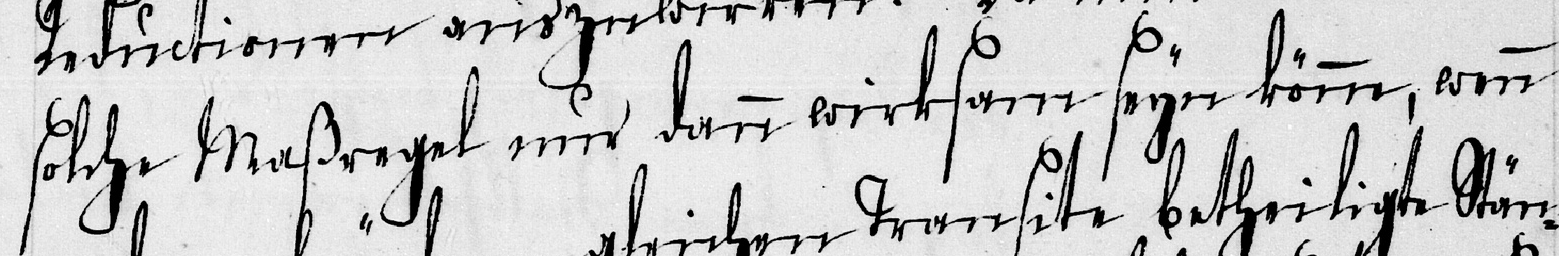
solche Maßregel nur dann wirksam seyn könne, wenn
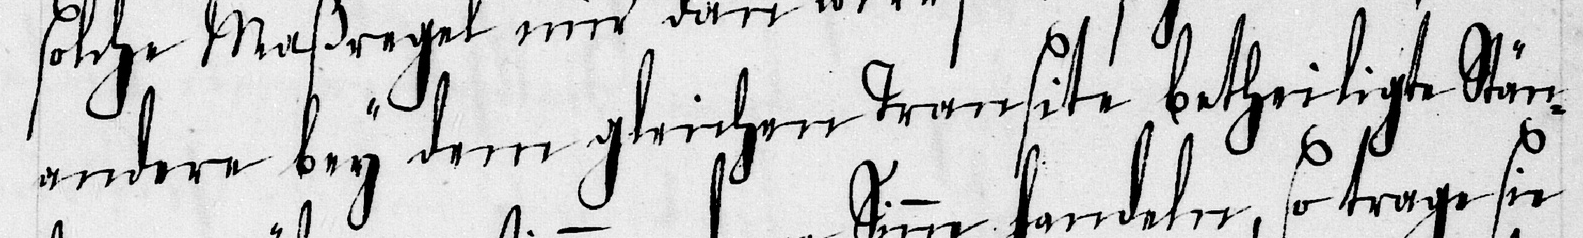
andere bey dem gleichen Transite betheiligte Stän¬
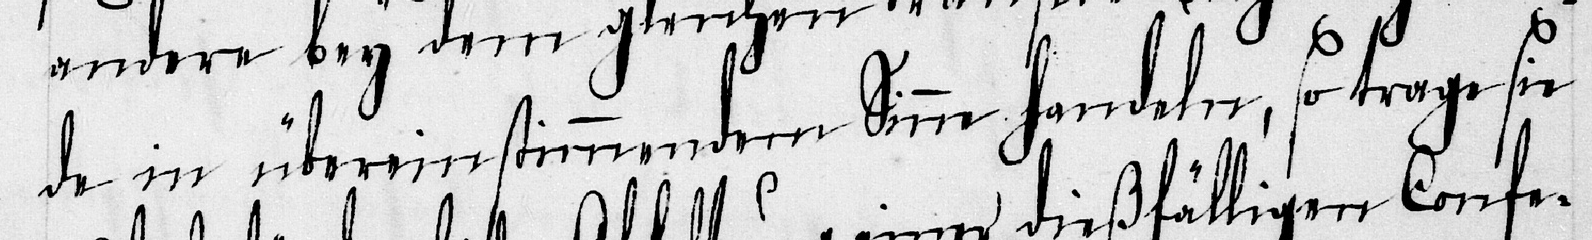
de in übereinstimmendem Sinne handeln, so trage sie
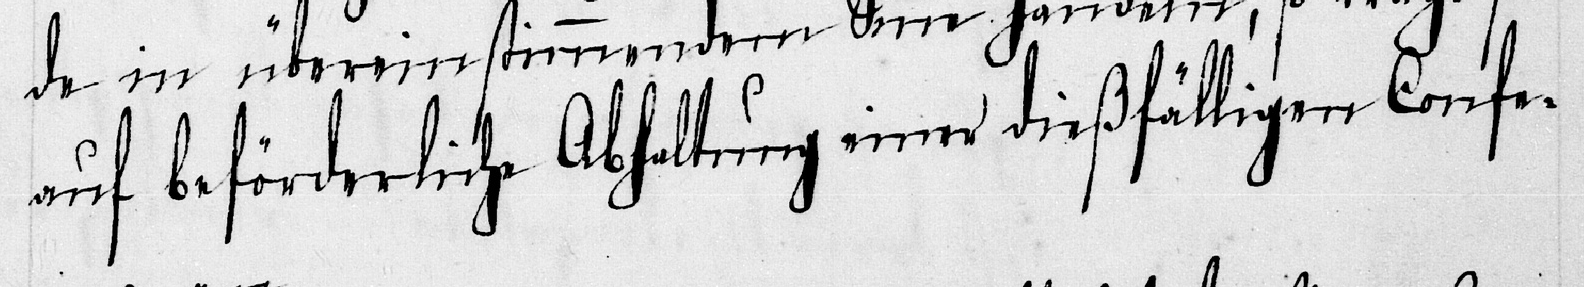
auf beförderliche Abhaltung einer dießfälligen Confe¬
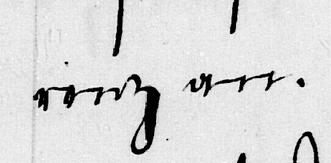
renz an.
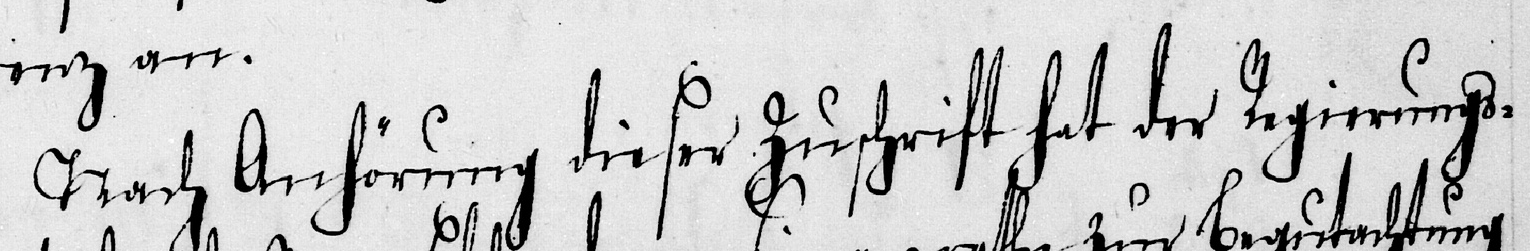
Nach Anhörung dieser Zuschrift hat der Regierung¬
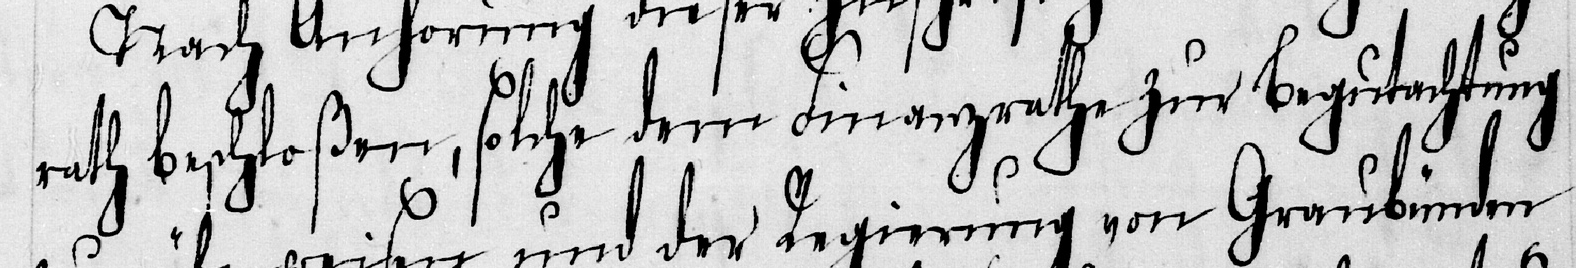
ath beschloßen, solche dem Finanzrathe zur Begutachtung
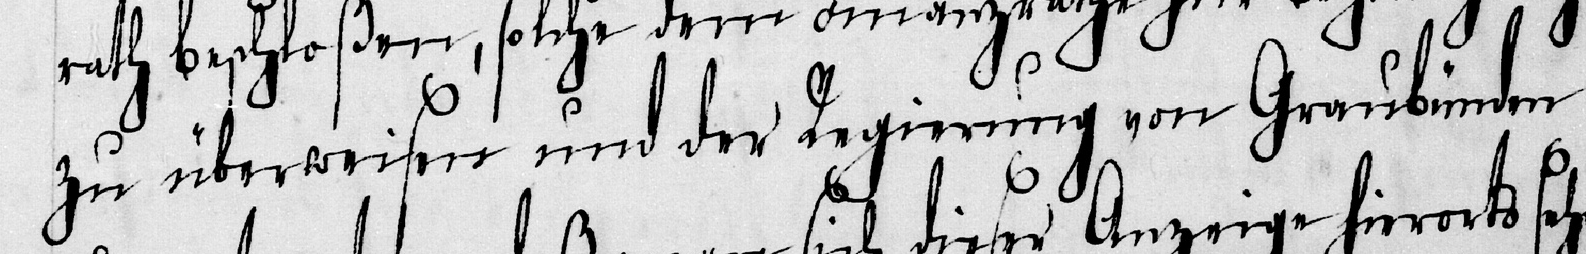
zu überweisen und der Regierung von Graubünden
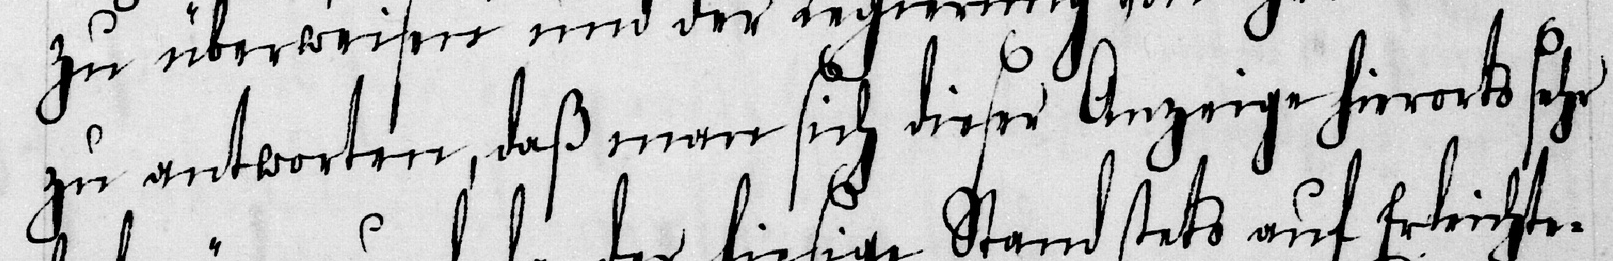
zu antworten, daß man sich dieser Anzeige hierorts se¬
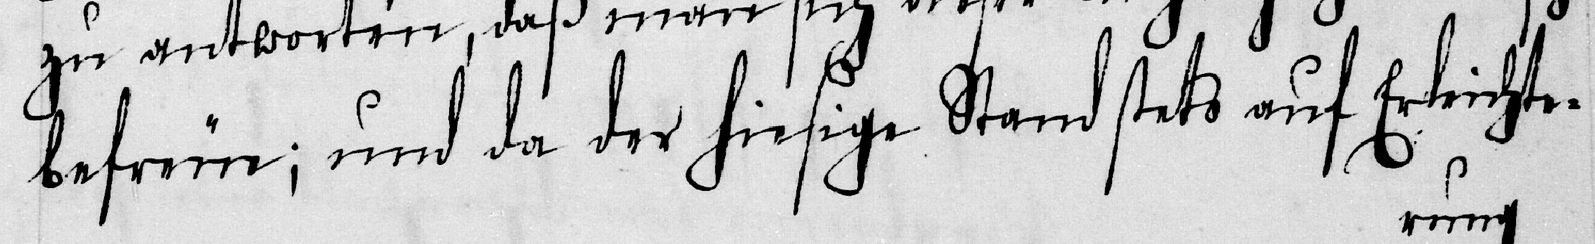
befreue; und da der hiesige Stand stets auf Erleich¬
